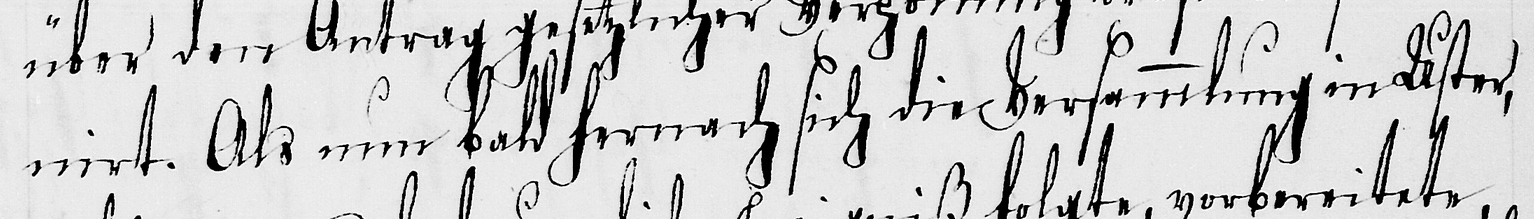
nirt. Als nun bald hernach sich die Versammlung in Uster,
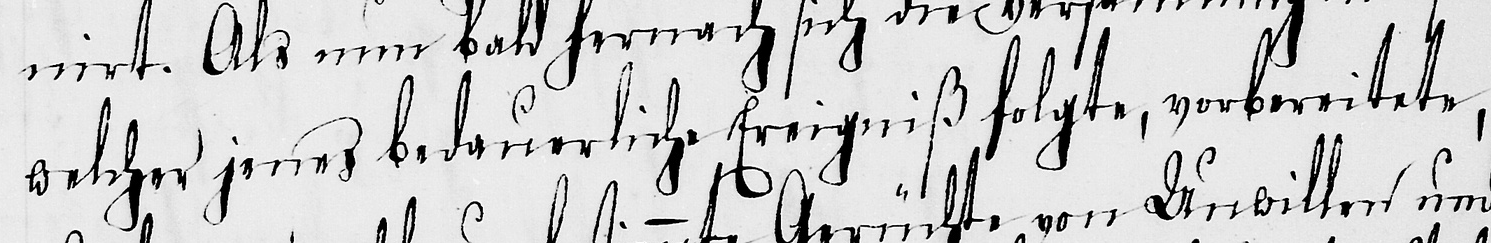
welcher jenes bedauerliche Ereigniß folgte, vorbereitete,
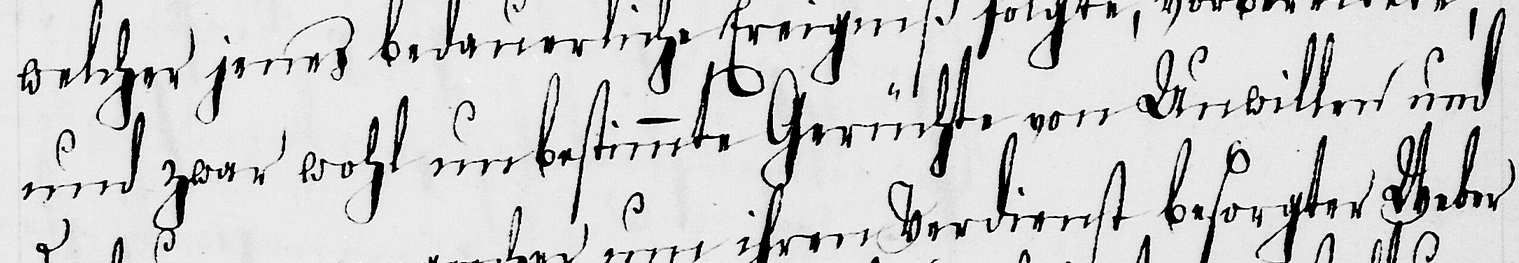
und zwar wohl unbestimmte Gerüchte von Unwillen und
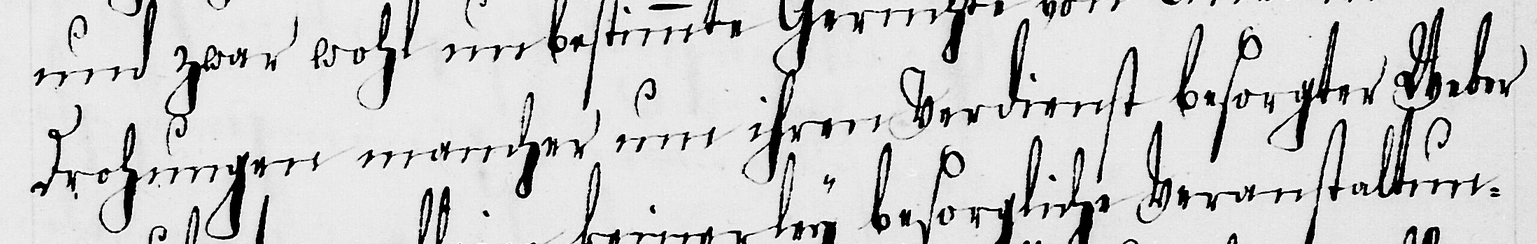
Drohungen mancher um ihren Verdienst besorgter Weber
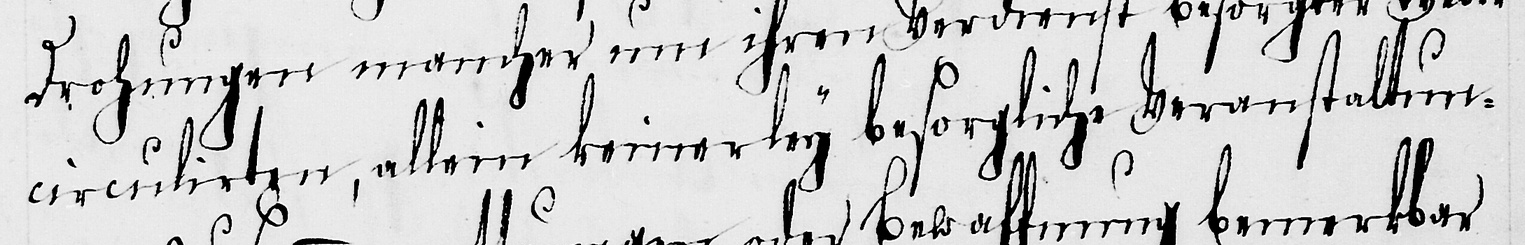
circulirten, allein keinerley besorgliche Veranstaltun¬
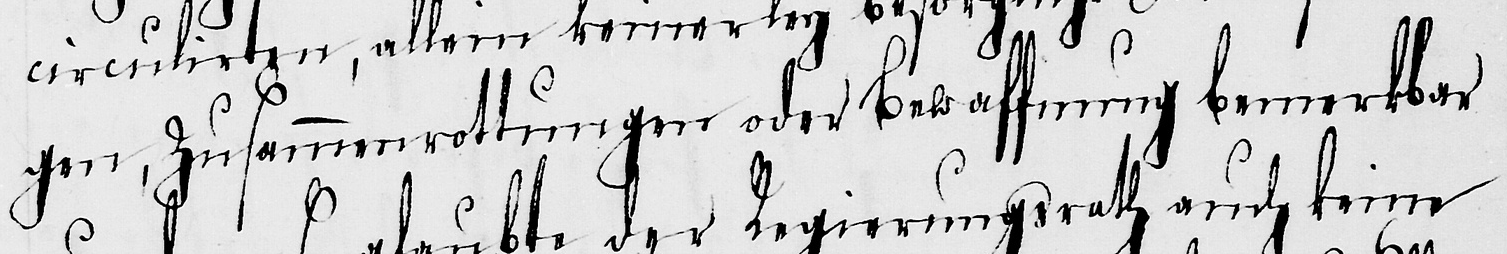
gen, Zusammenrottungen oder Bewaffnung bemerkbar
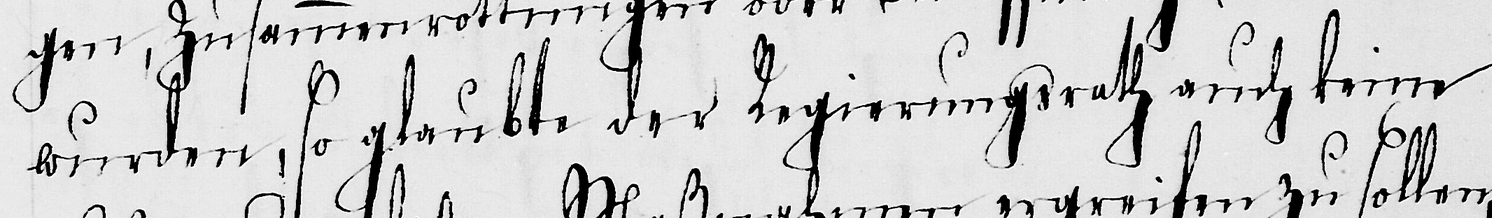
wurden, so glaubte der Regierungsrath auch keine
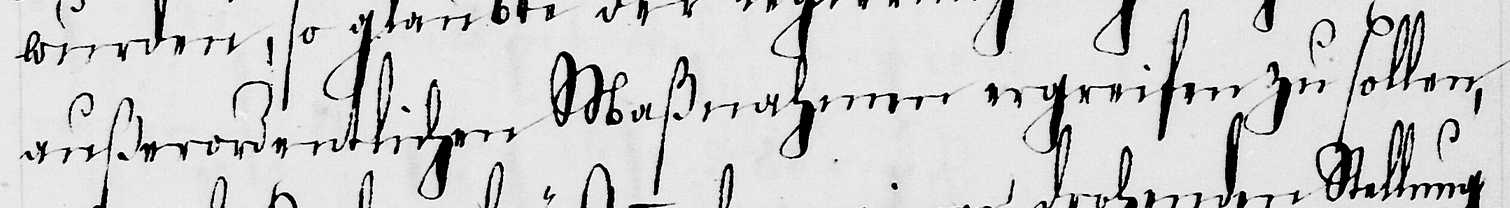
außerordentlichen Maßnahmen ergreifen zu sollen,
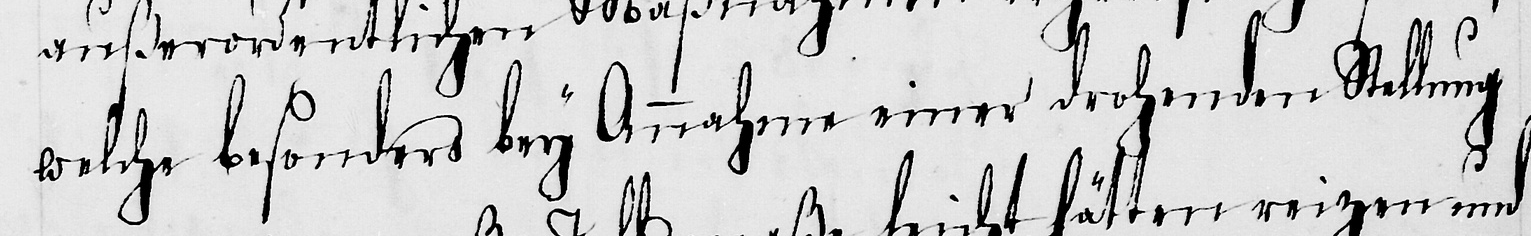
welche besonders bey Annahme einer drohenden Stellung
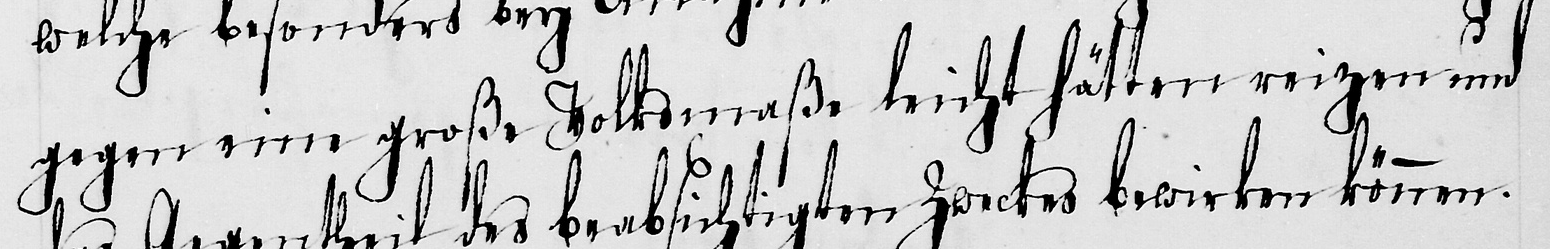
gegen eine große Volksmaße leicht hätten reizen und
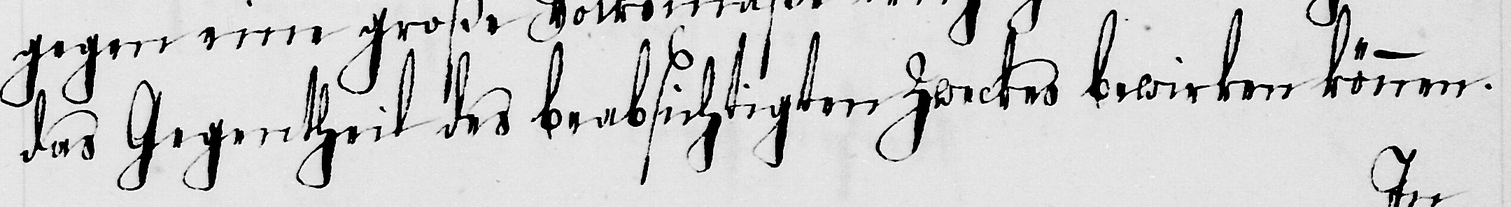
das Gegentheil des beabsichtigten Zweckes bewirken können.
